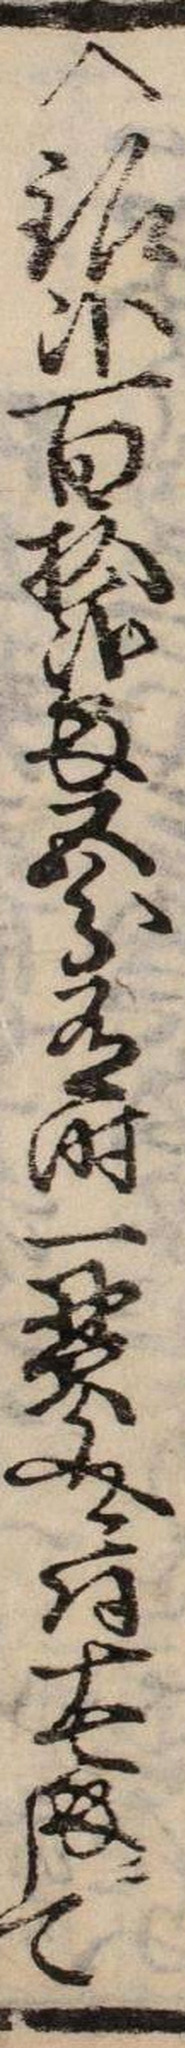△銀弐百拾弐匁五分有時一貫文に付十七匁にして
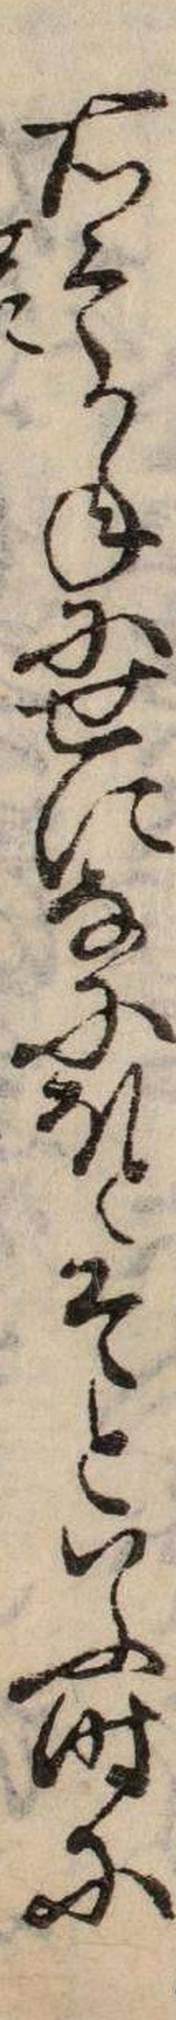右のかねにせになにほとそといふ時に
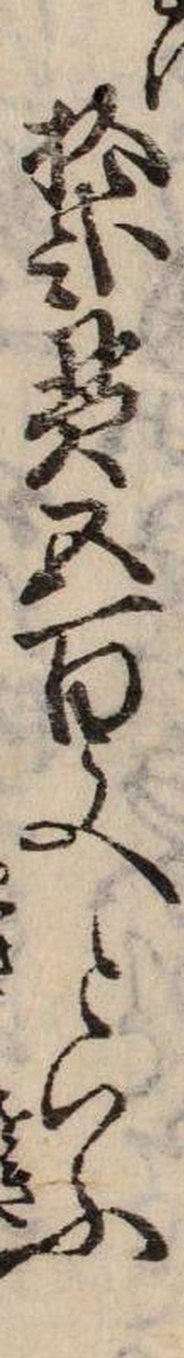せに拾弐貫五百文といふ
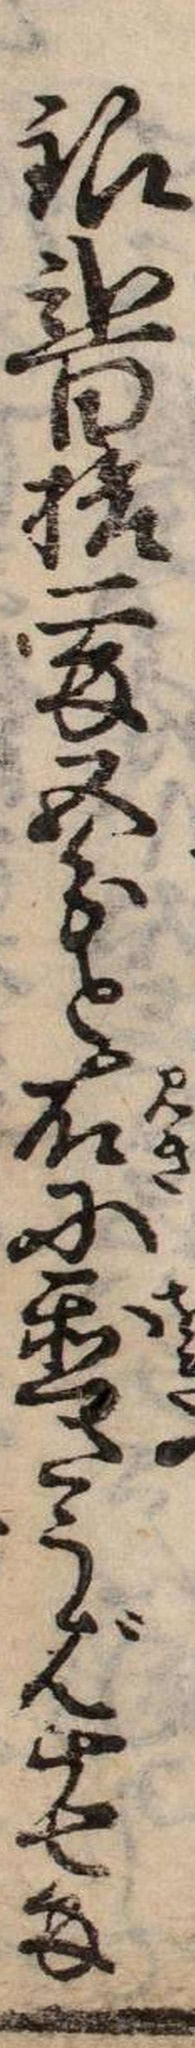銀弐百拾二匁五分と右に置さうば十七匁
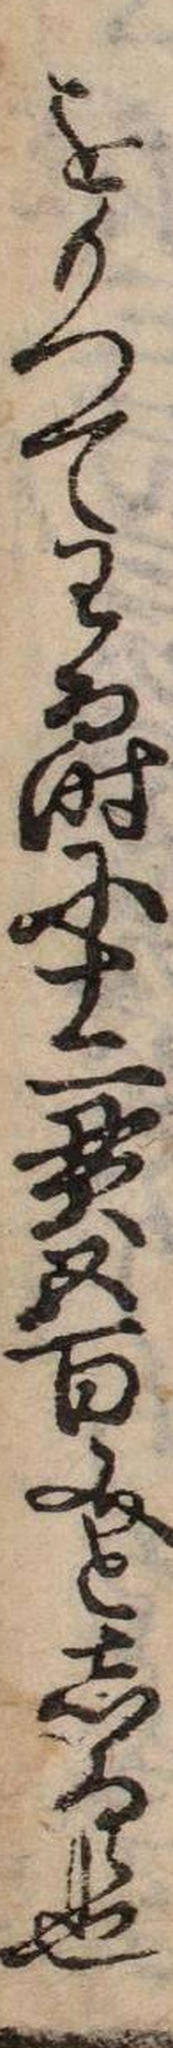をもつてわる時に十二貫五百文としるゝ也

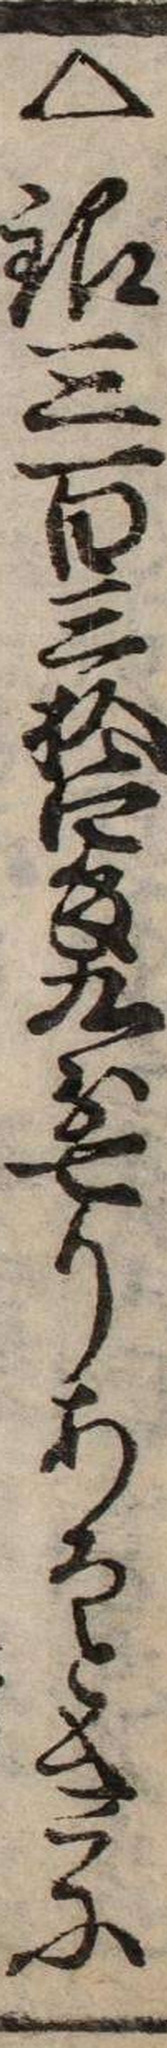△銀三百三拾四匁九分七りあるときに
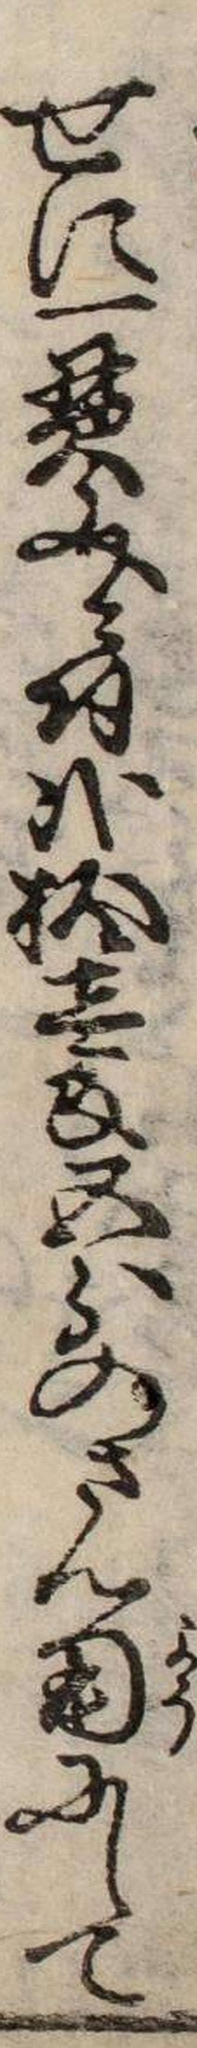せに一貫文に付弐拾壱匁五分のさん用にして
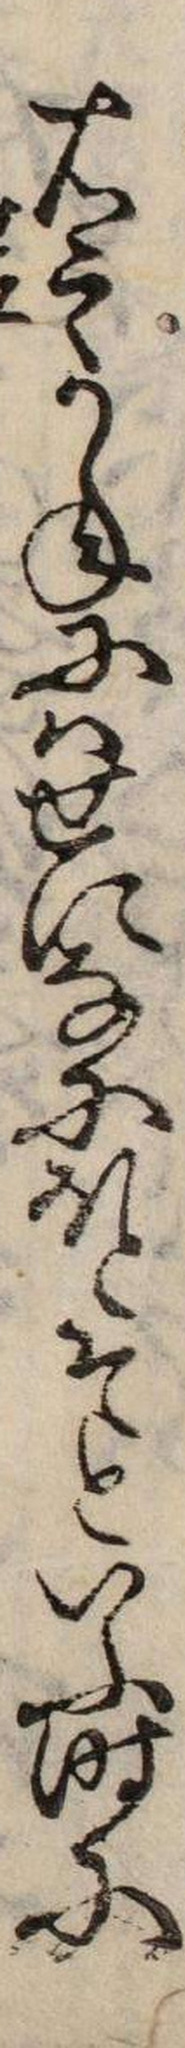右のかねにはせになにほとそといふ時に
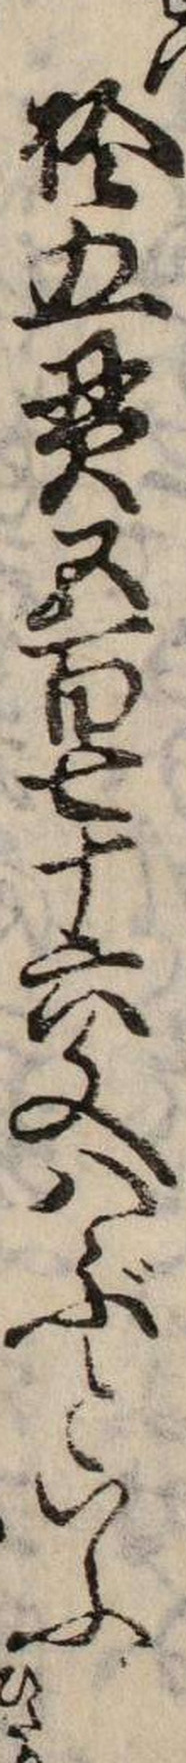せに拾五貫五百七十六文八ぶといふ
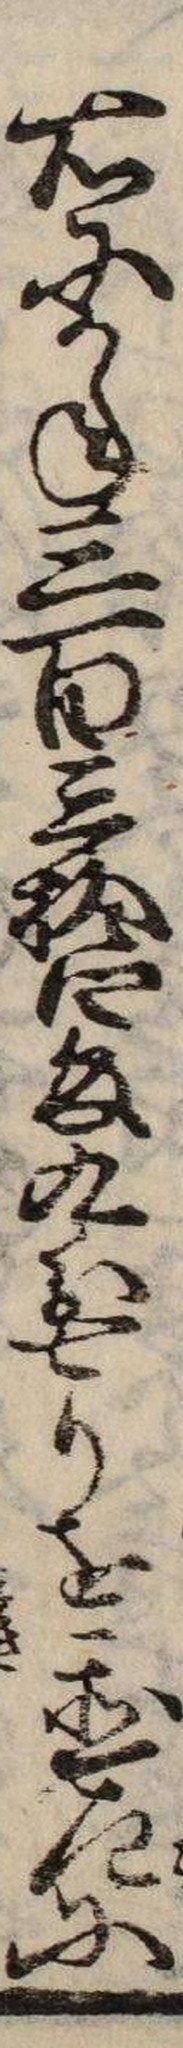右にかね三百三拾四匁九分七りを置左に
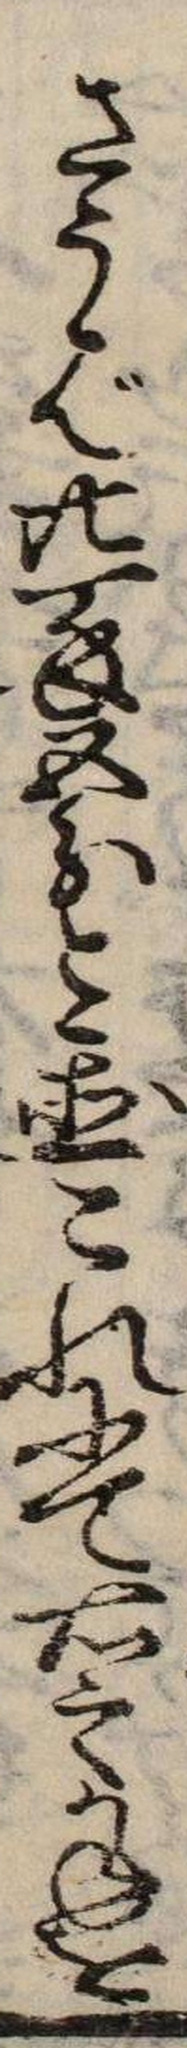さうば廿一匁五分と置これにて右のかねを
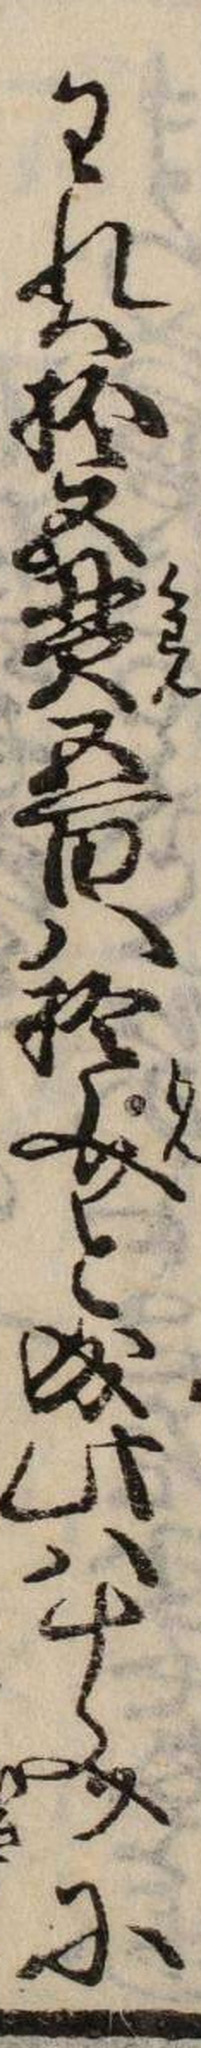われは拾五貫五百八拾文と成此八十文に
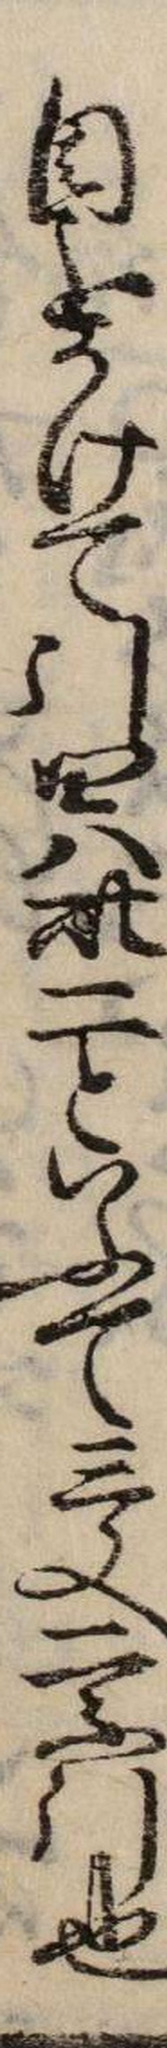目をかけて引四八卅二といふて三文二ぶ引也
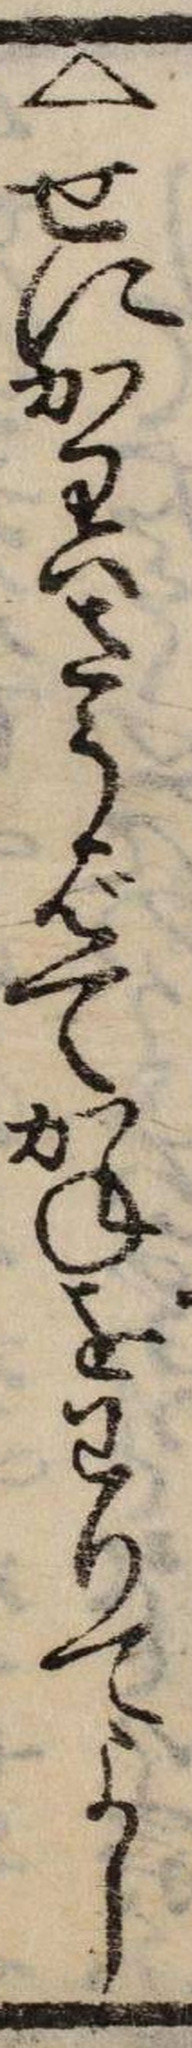△せにかわはさうばてかねをわりてよし
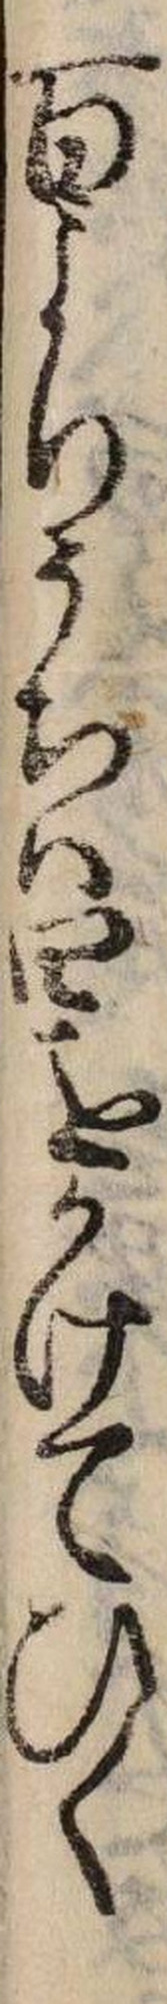百よりうちは四をかけてひく
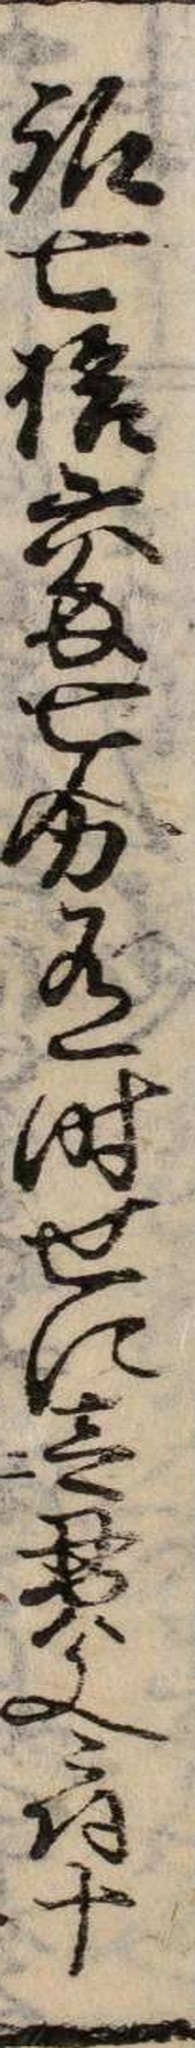銀七拾六匁七分有時せに壱貫文に付十
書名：塵劫記（寛永11年自跋、京都府立京都学・歴彩館追貴8）
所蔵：京都府立京都学・歴彩館 国文学研究資料館
